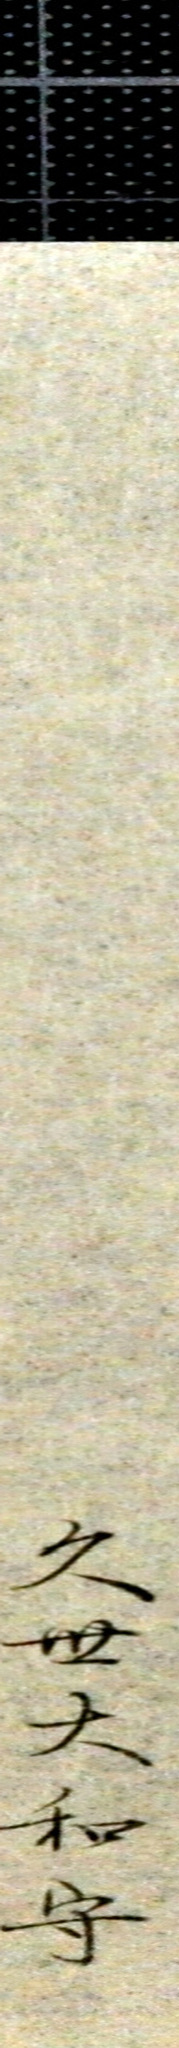久世大和守
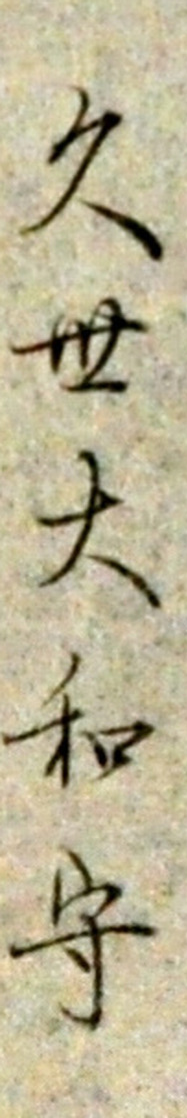久世大和守

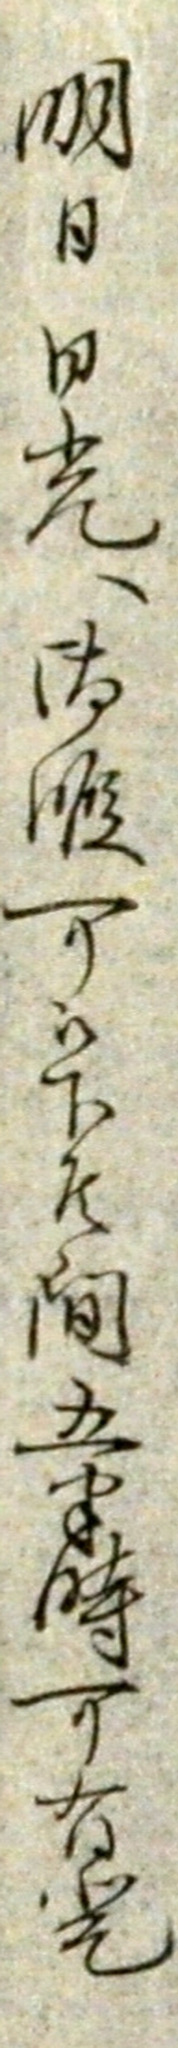明日日光へ御渡可被下候間五半時可有登
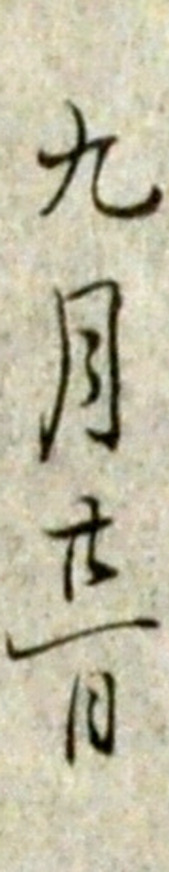九月廿一日
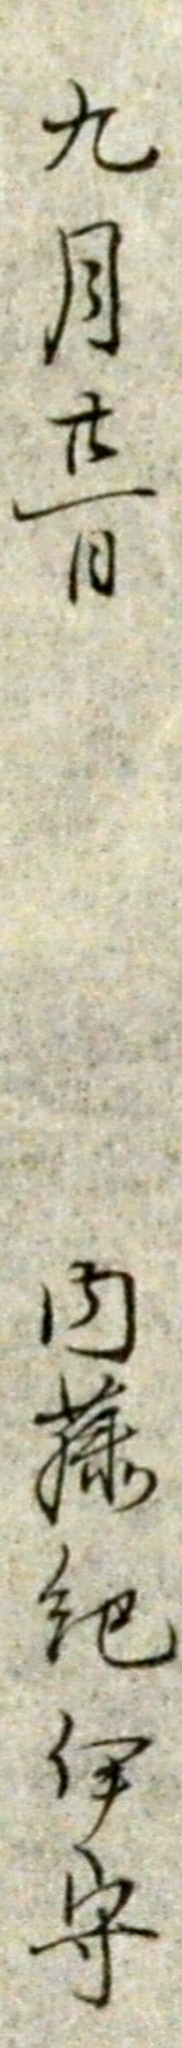九月廿一日内藤紀伊守
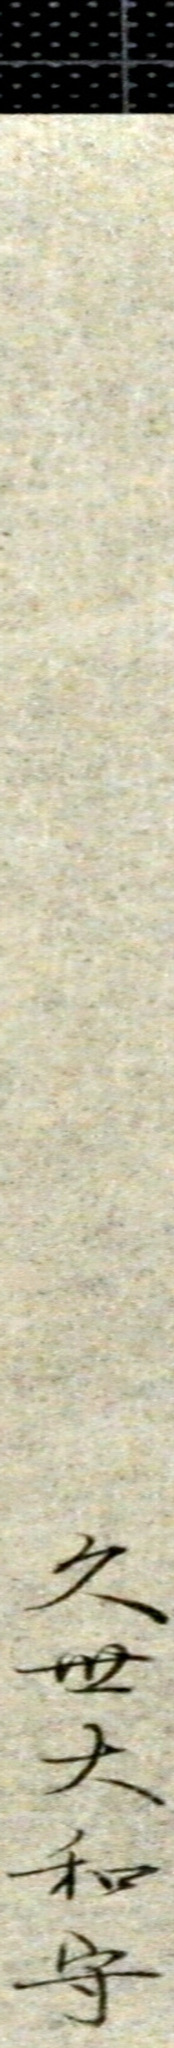久世大和守
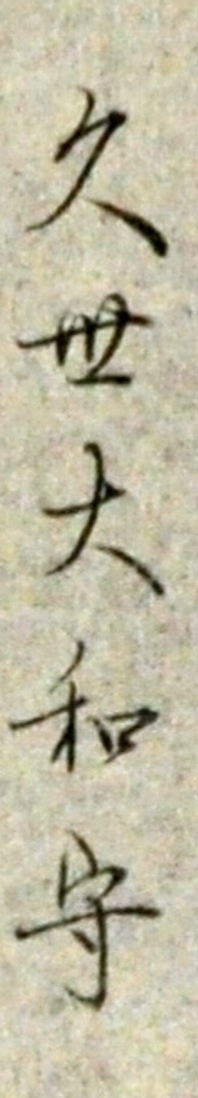久世大和守
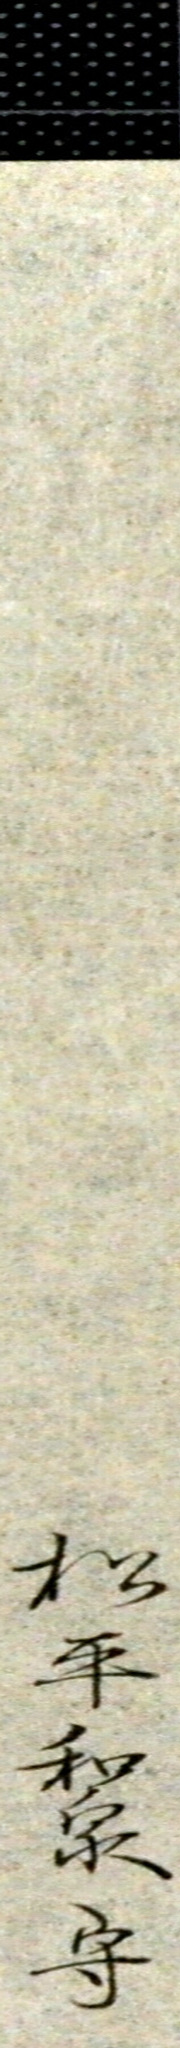松平和泉守
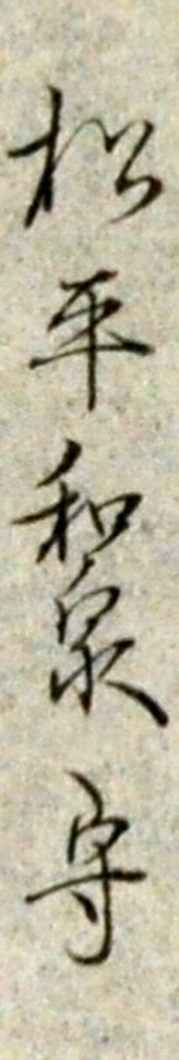松平和泉守
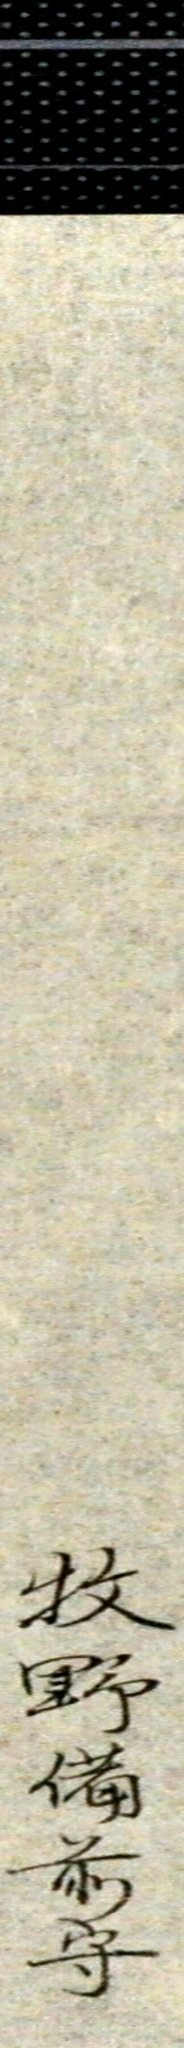牧野備前守
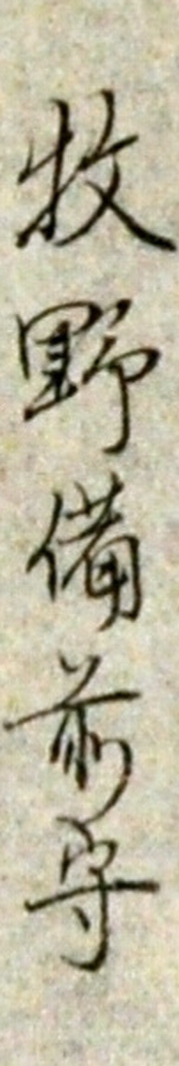牧野備前守
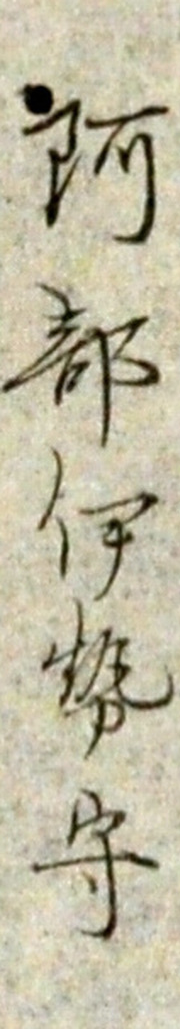阿部伊勢守
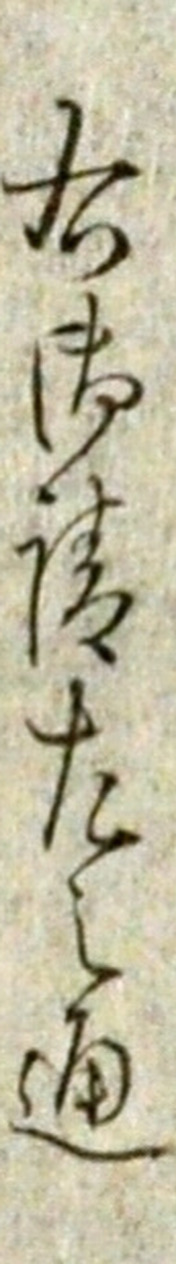右御請左之通
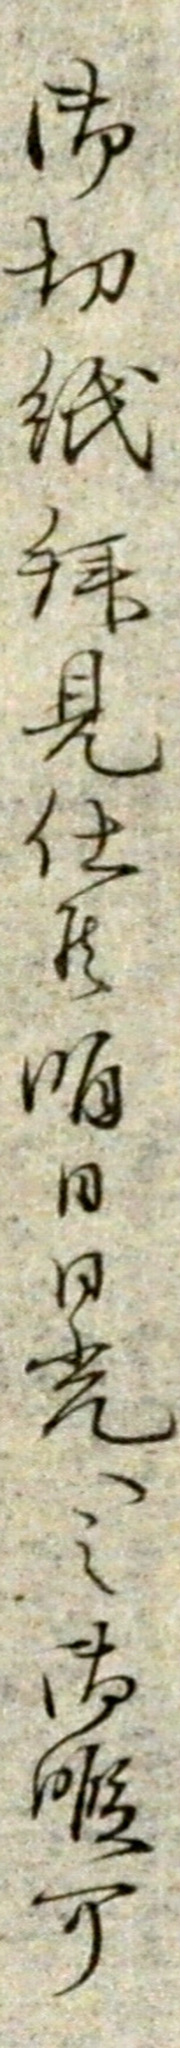御切紙拝見仕候昨日日光へ之御暇可
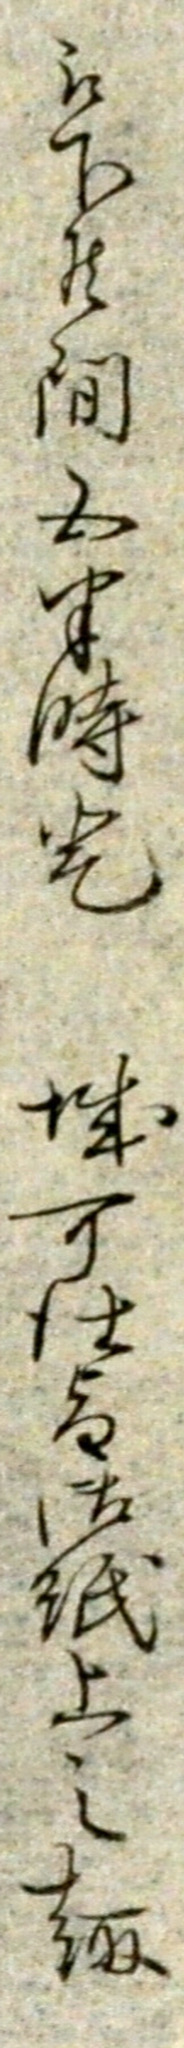被下候間五半時登城可仕旨御紙上之趣
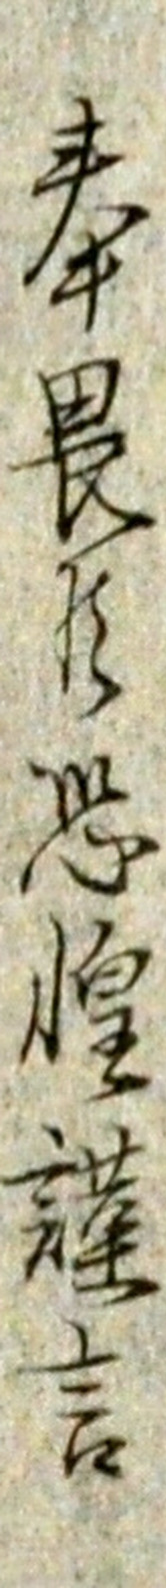奉畏候恐惶謹言
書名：日光御名代相勤候節ノ留
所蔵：伊那市立高遠町図書館・合同会社AMANE
